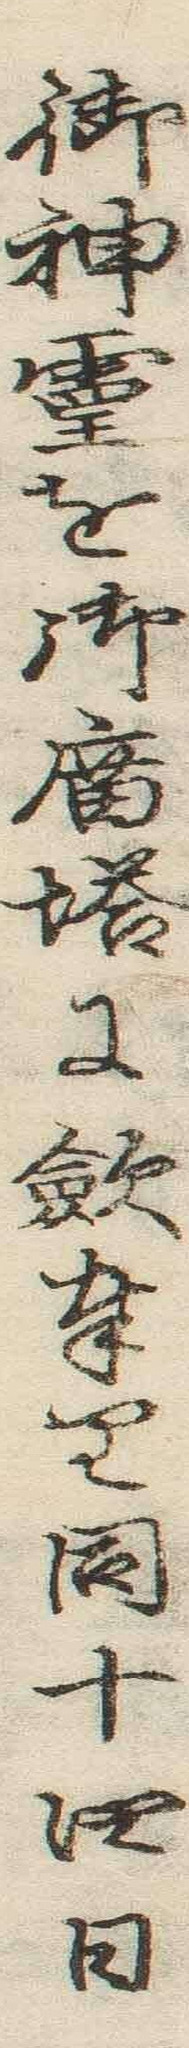御神靈を御庿塔に歛奉り同十四日

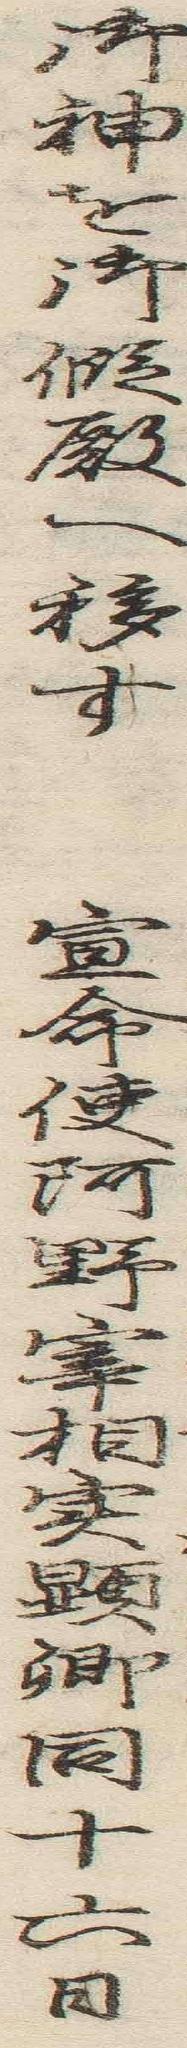御神を御假殿へ移す宣命使阿野宰相実顕卿同十六日
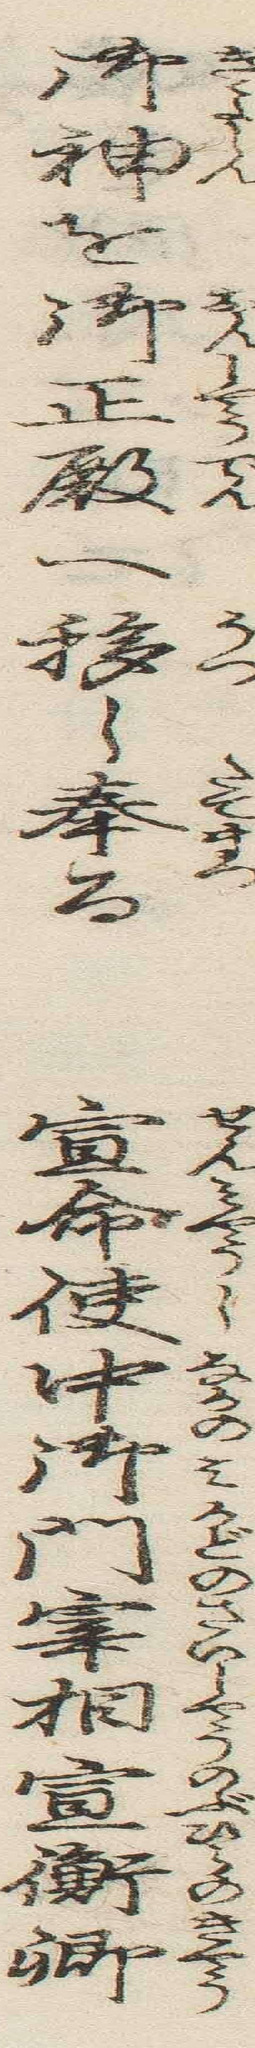御神を御正殿へ移し奉る宣命使中御門宰相宣衡卿
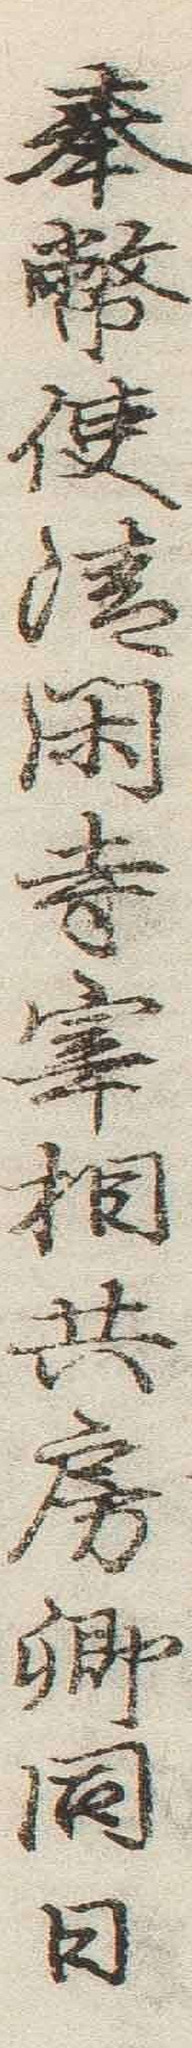奉幣使清閑寺宰相共房卿同日
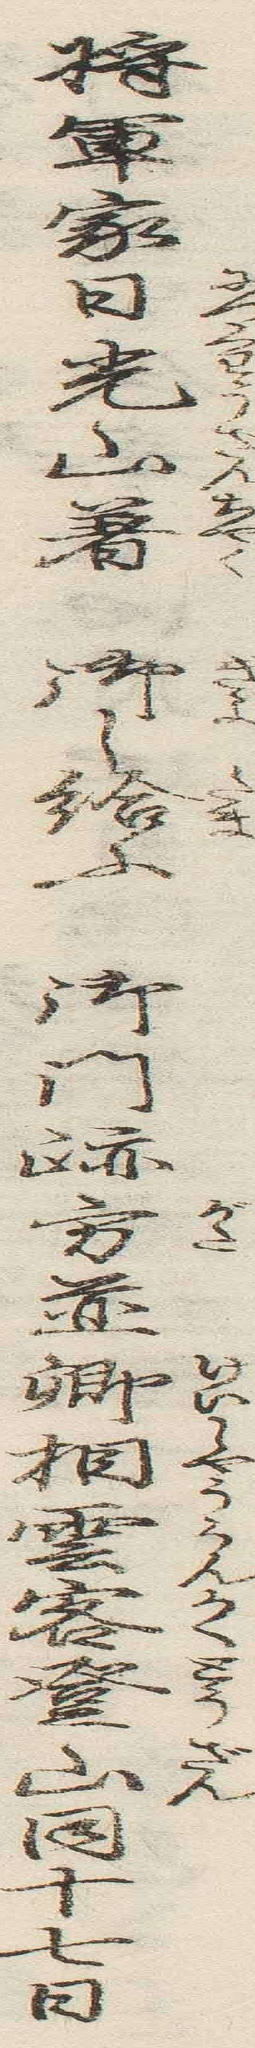将軍家日光山着御し給ふ御門跡方並卿相雲客登山同十七日
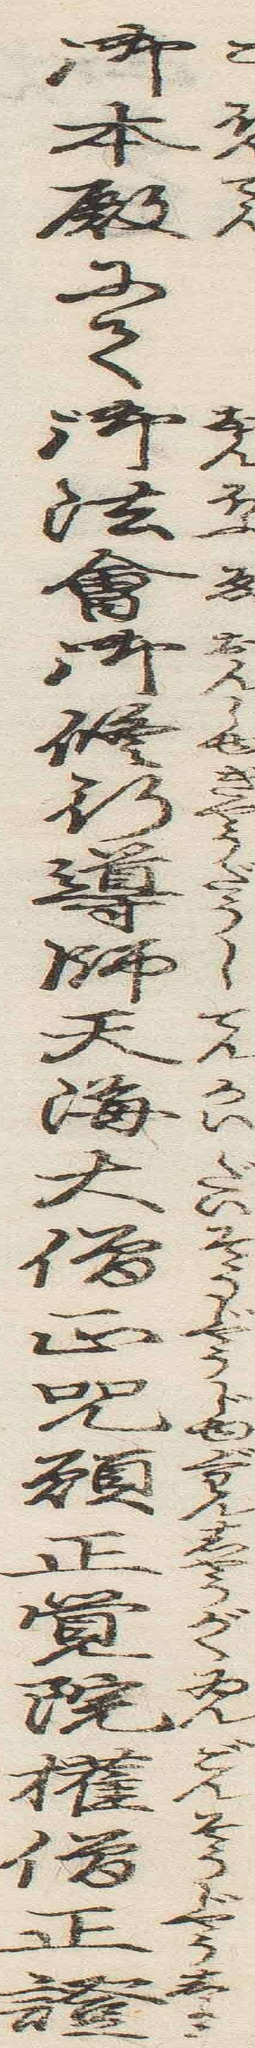御本殿にて御法會御修行導師天海大僧正咒願正覚院權僧正證
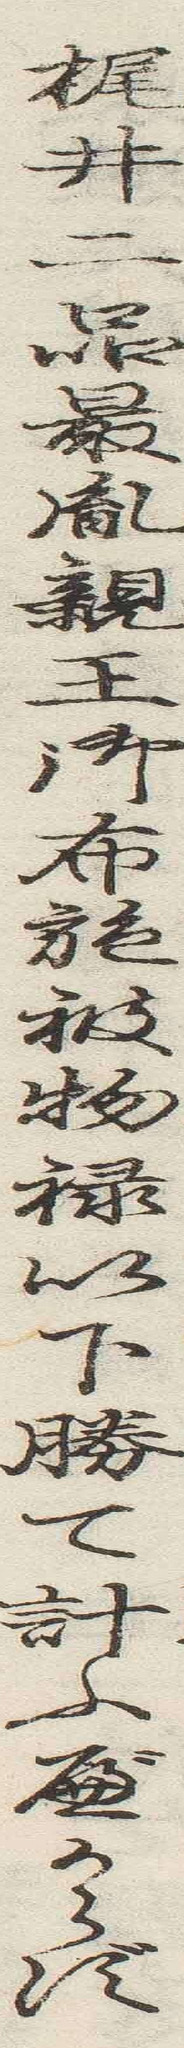梶井二品最胤親王御布施被物禄以下勝て計ふべからず
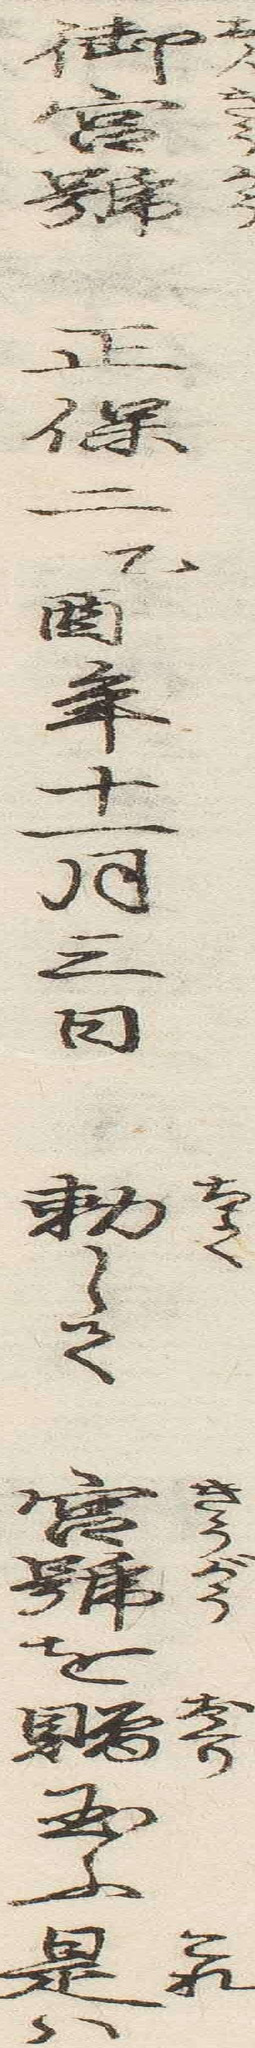御宮號正保二乙酉年十一月三日勅して宮號を贈玉ふ是は
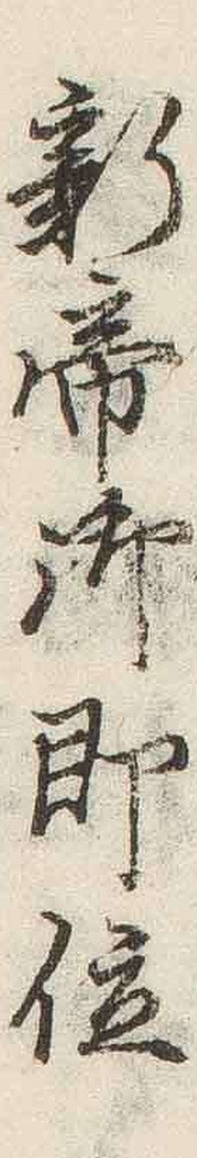新帝御即位
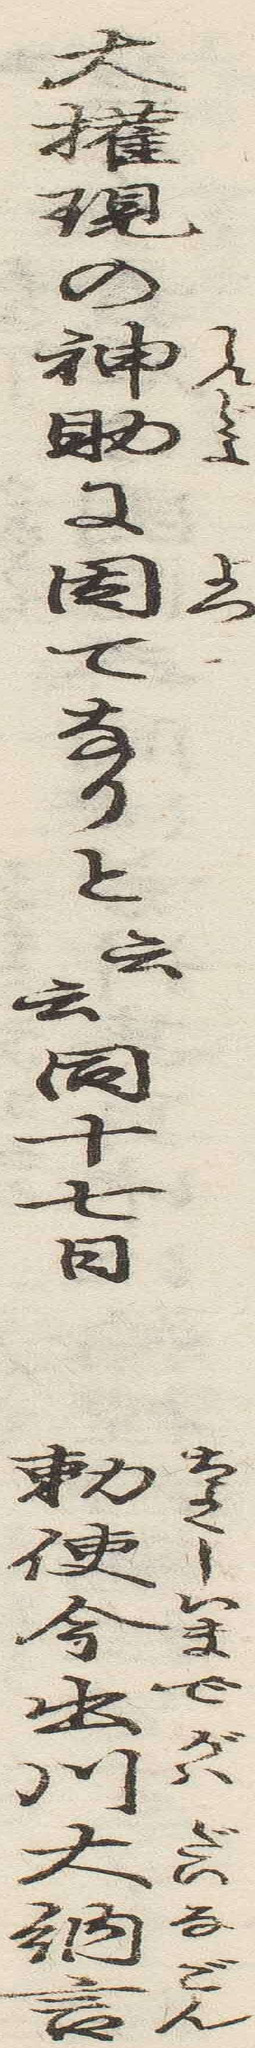大權現の神助に因てなりと云云同十七日勅使今出川大納言
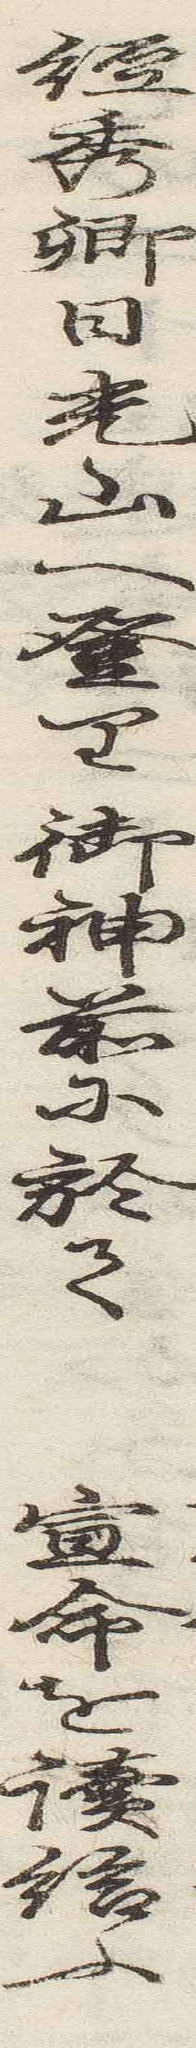經秀卿日光山へ登り御神前に於て宣命を讀給ふ
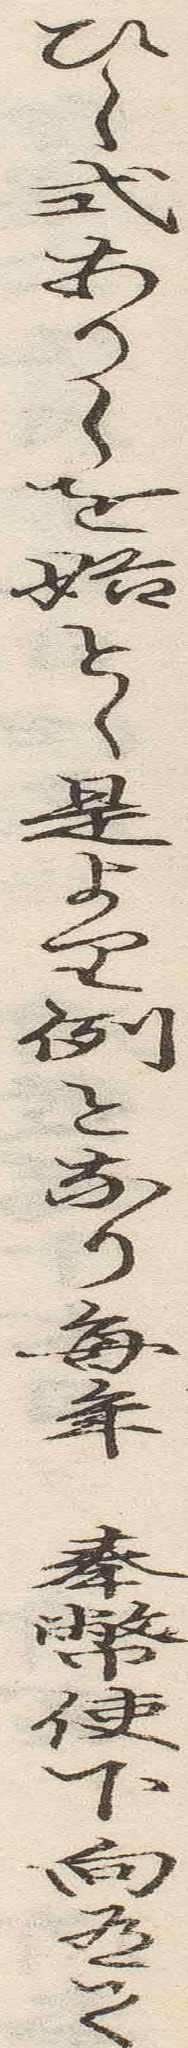ひし式ありしを始とし是より例となり毎年奉幣使下向有て
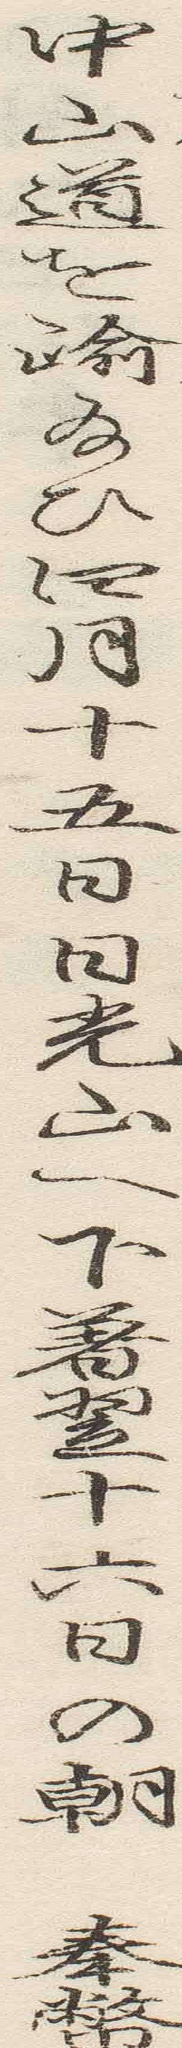中山道を踰給ひ四月十五日日光山へ下着翌十六日の朝奉幣
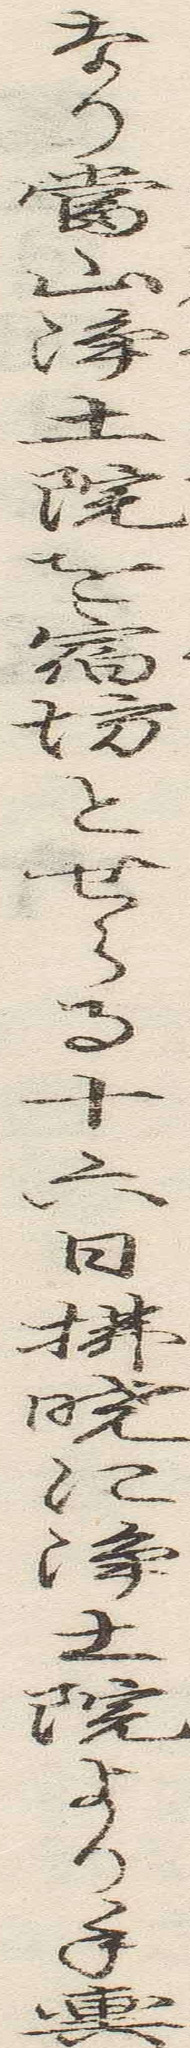なり當山浄土院を宿坊とせらる十六日拂暁に浄土院より手輿
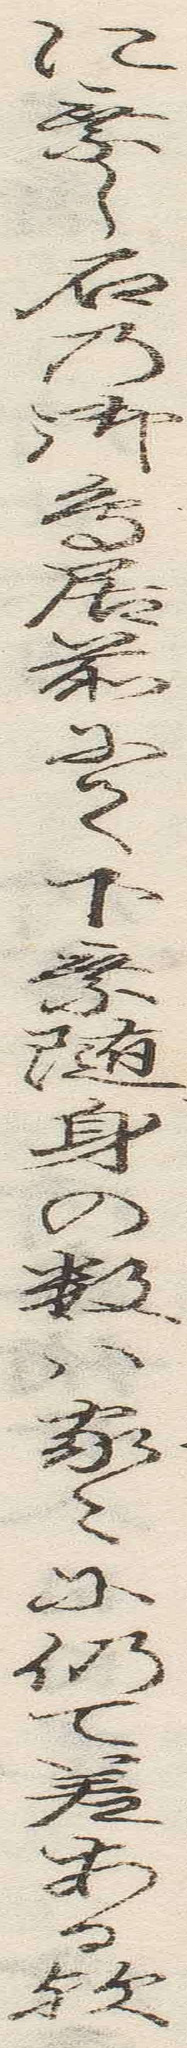に乗し石の御鳥居前にて下乗随身の数は家〻に仍て差ある欤
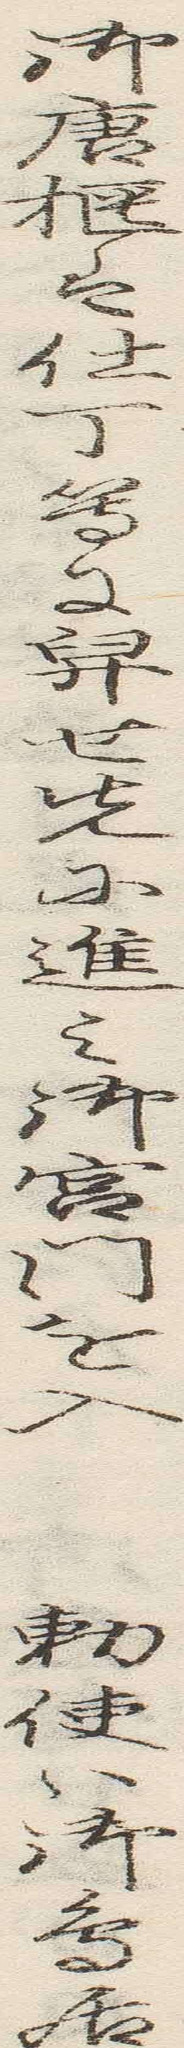御唐櫃は仕丁等に舁せ先に進み御宮門を入勅使は御鳥居
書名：日光山志
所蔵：東京学芸大学附属図書館 国文学研究資料館
